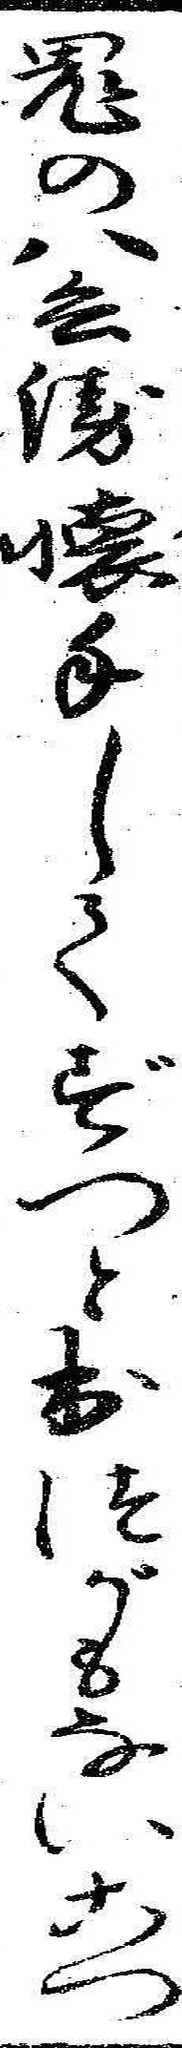鬼の八兵衛懐手してずつと出つがもないこつ
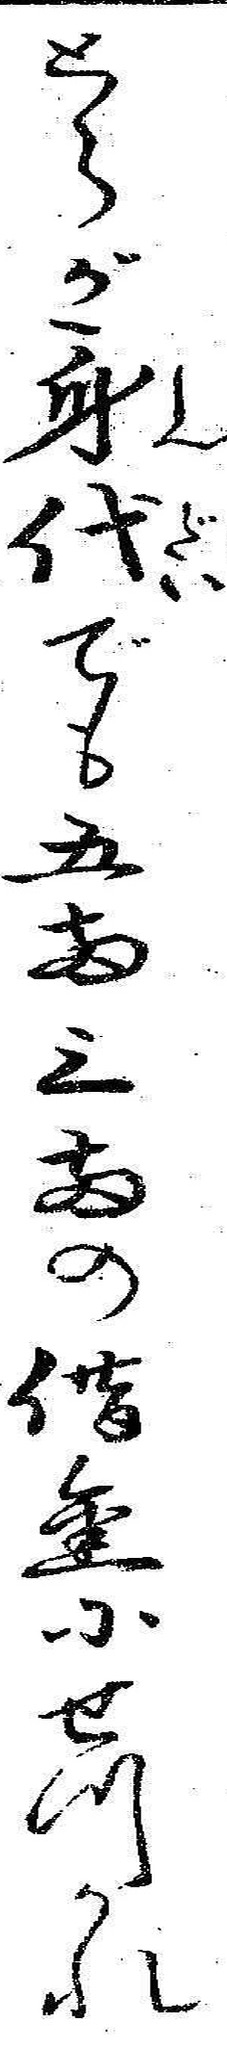とらが身代でも五両三両の借金にせつかれ
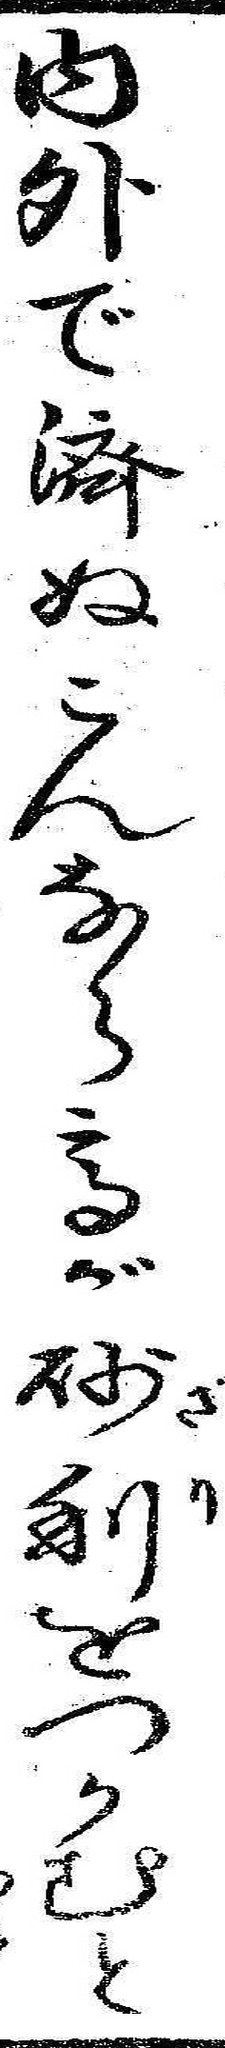内外で済ぬこんなら高が砂利をつかむと
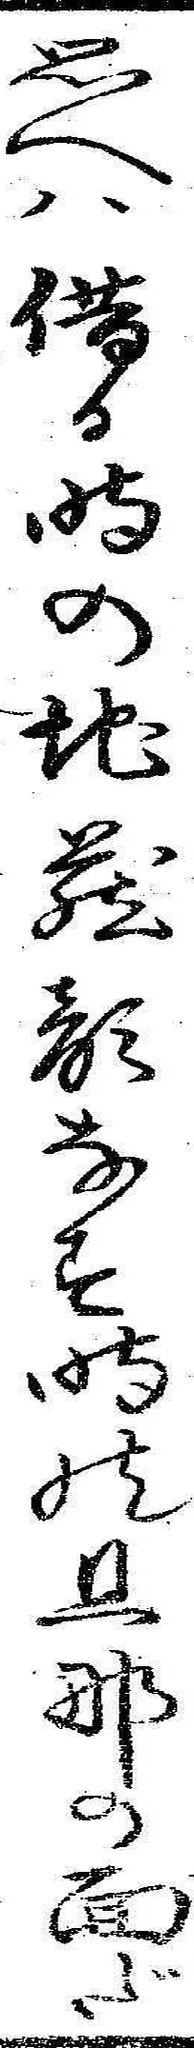思へは借る時の地蔵顔なす時の且那の面だ
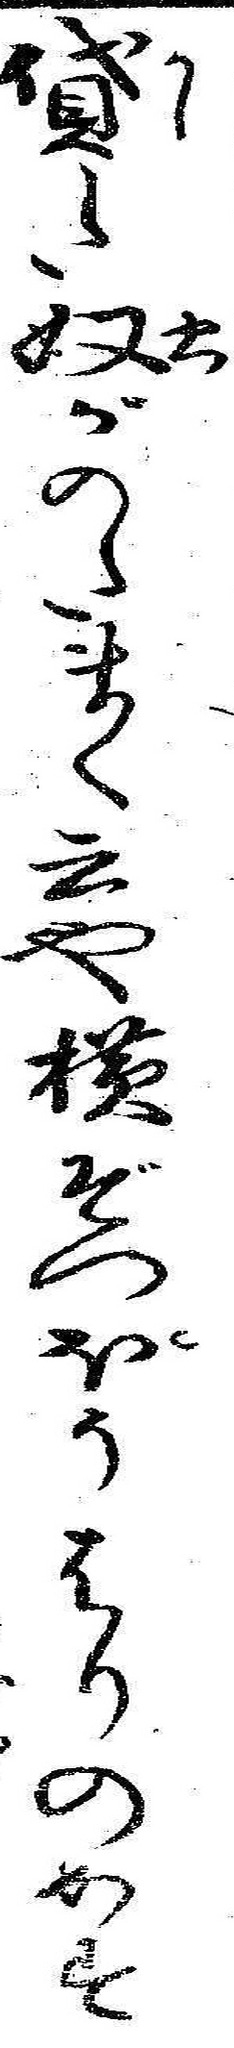貸た奴がのたまく云や横ぞつぽうはりのめす
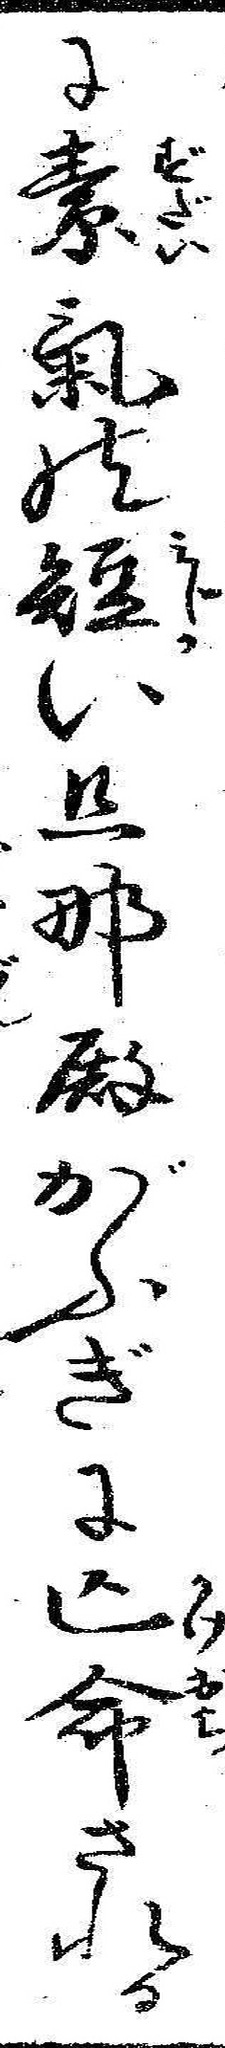に素気の短い且那殿がふぎに亡命される
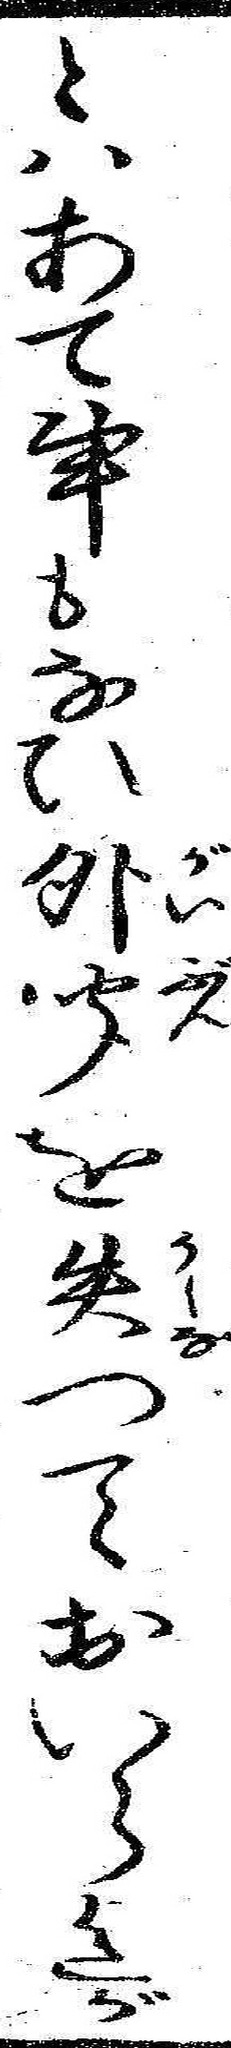とはあて事もなひ外聞を失つておいら迄が
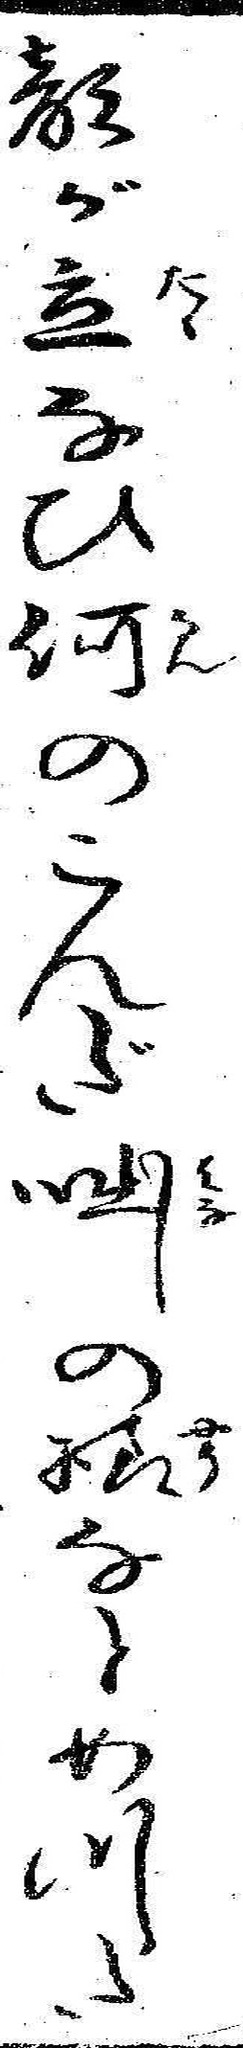顔が立なひ何のこんだ咄しの様なとめつた
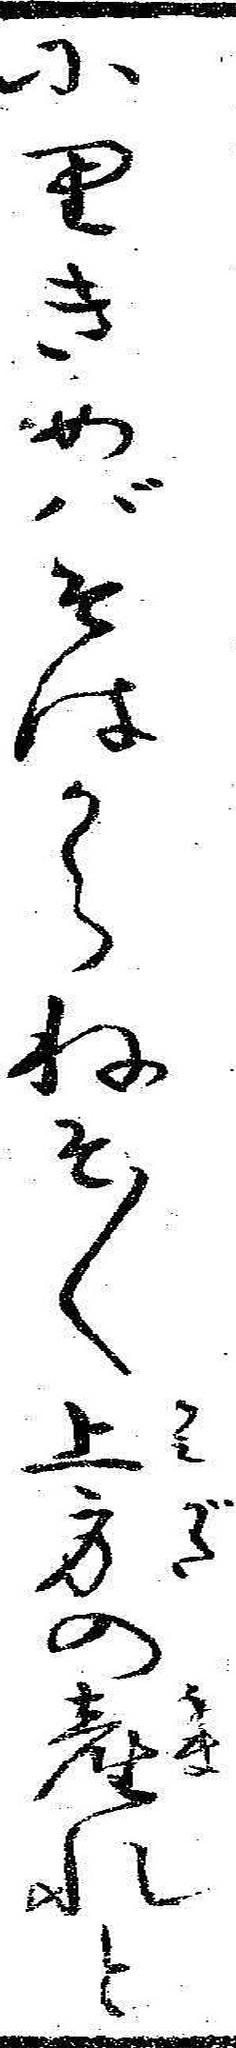にりきめばそはからねそ〱上方の産れと

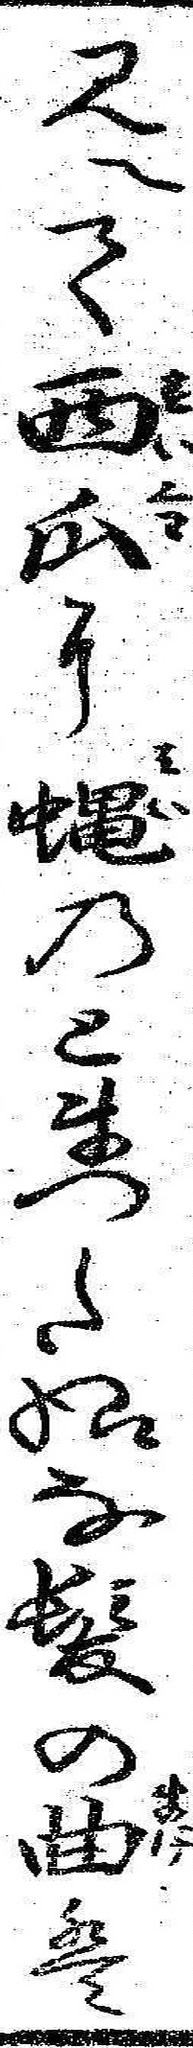見へて西瓜に蝿のとまつた様な髪の曲は
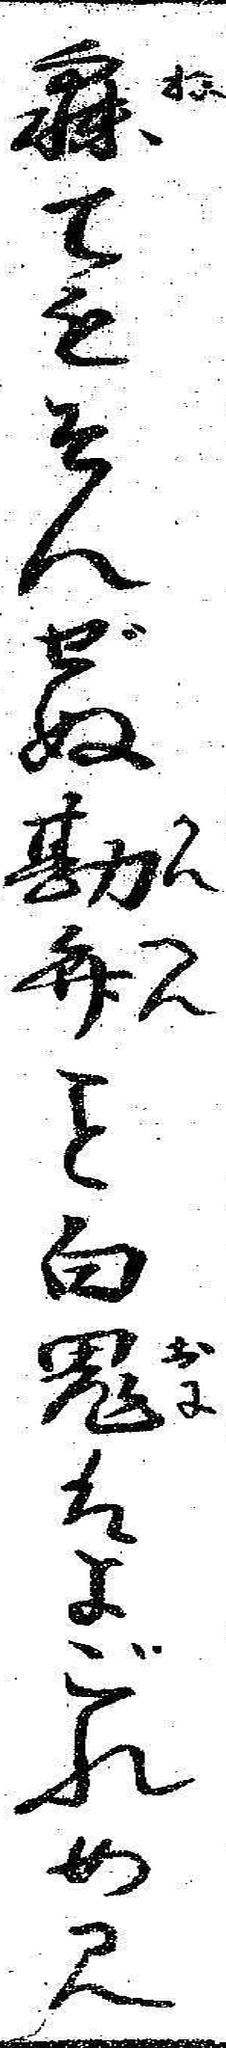寝てもそんぜぬ勘弁こと白鬼はよごれめ見
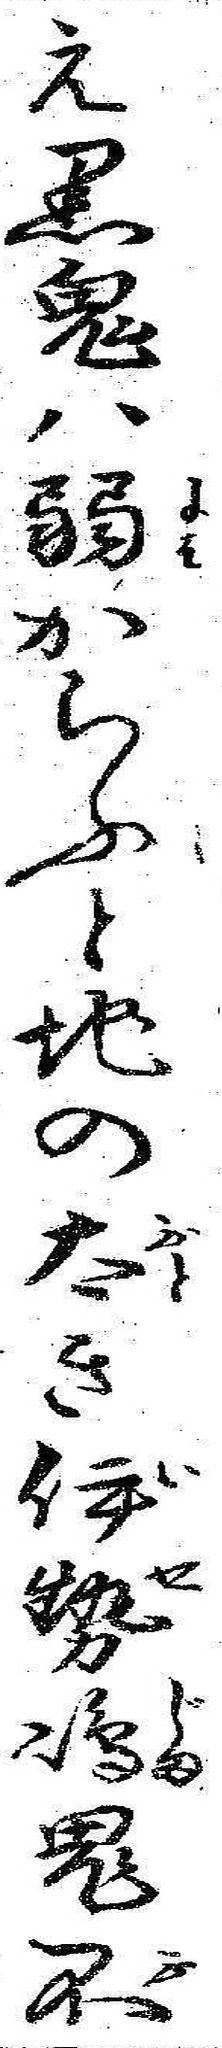え黒鬼は弱からふと地の太き伊勢島鬼不
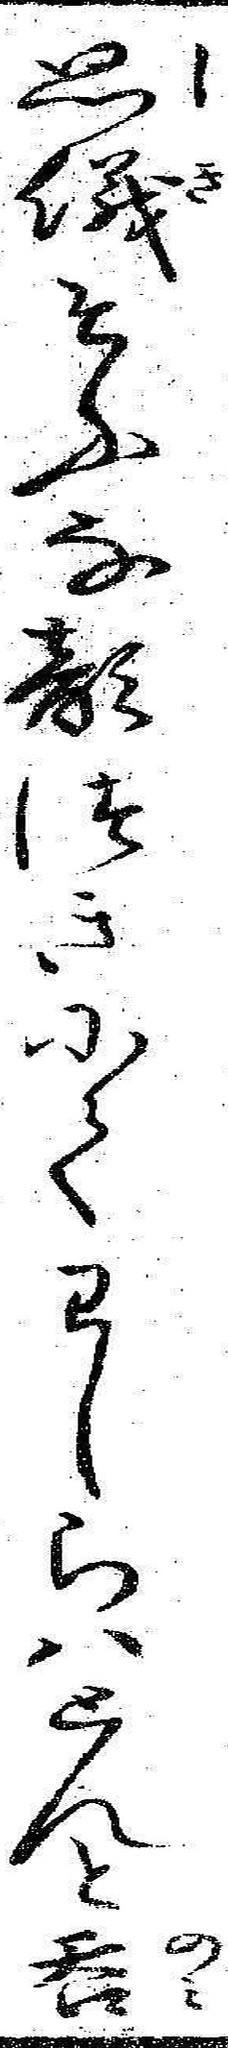思儀そふな顔つきにてわしらはとんと呑
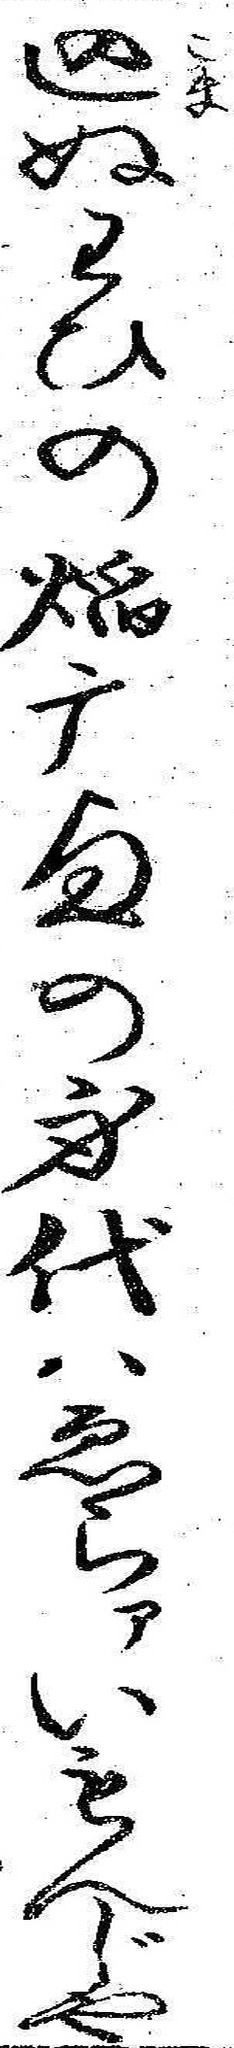込ぬわひの焔魔様の身代はゑら
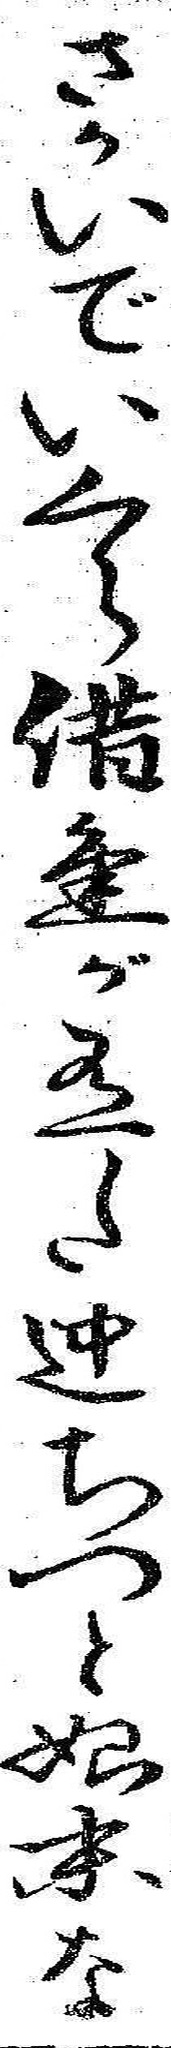さかいでいくら借金が有た迚ちつと始末な
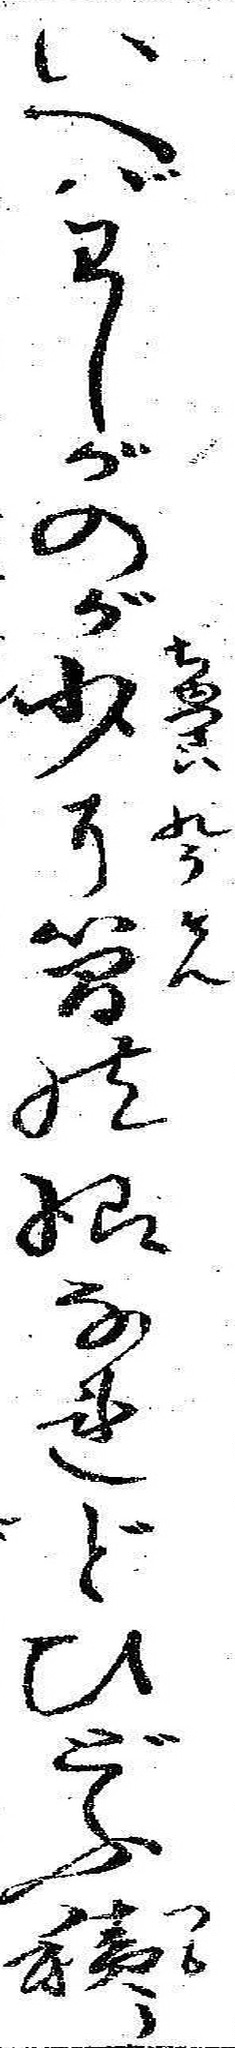いへばわしがのが少了簡の様なれどひどふ積り
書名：根無草後編
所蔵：国文学研究資料館
